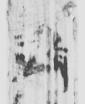{豆攴}
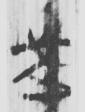武
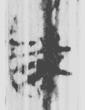威
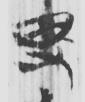卑
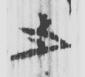之
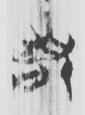若
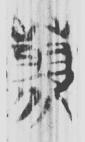蓼
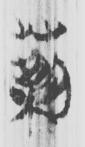{艸剌}
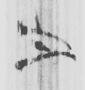之
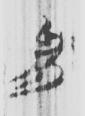易
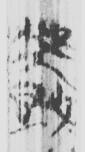戲
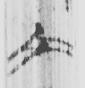文
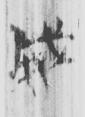威
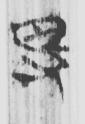卑
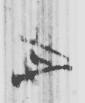之
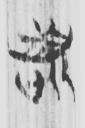若
